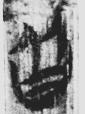皆
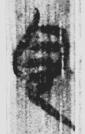見
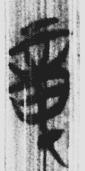章（彰）
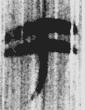于
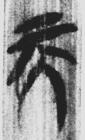天
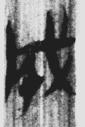成
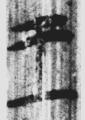王
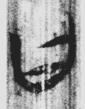曰
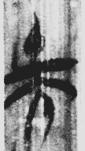夫
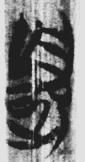○（夏）
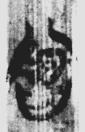曾（繒）
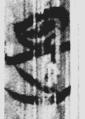是（氏）
